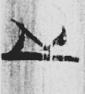之
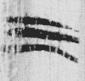三
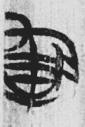軍
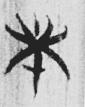未
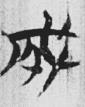成
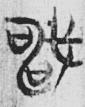○（陳）
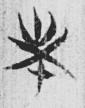未
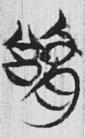豫
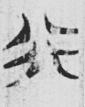行
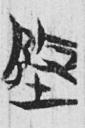○（阪）
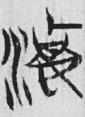淒（濟）
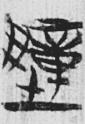○（障）
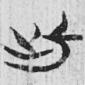此
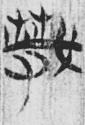○（散）
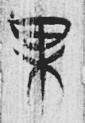果（裹）
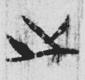之
